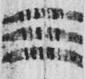三
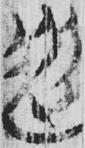從
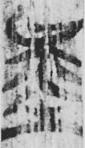○（舜）
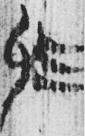於
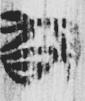旬（畎）
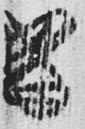○（畝）
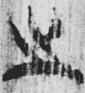之
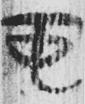𠁩
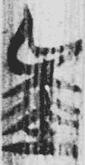○（舜）
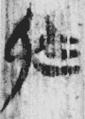於
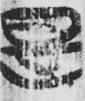是
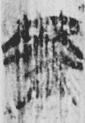{虍介}（乎）
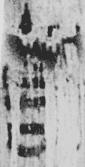○（始）
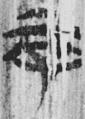○（免）
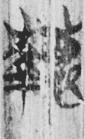執（執）
